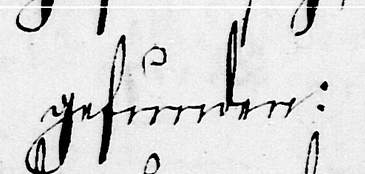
gefunden:
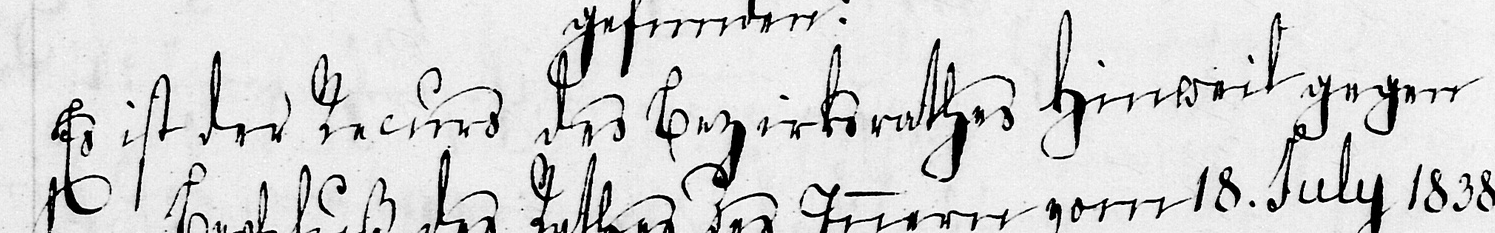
Es ist der Recurs des Bezirksrathes Hinweil gegen
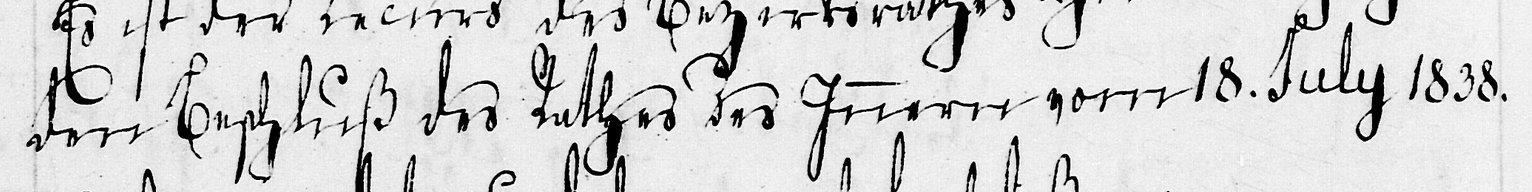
den Beschluß des Rathes des Innern vom 18. July 1838.
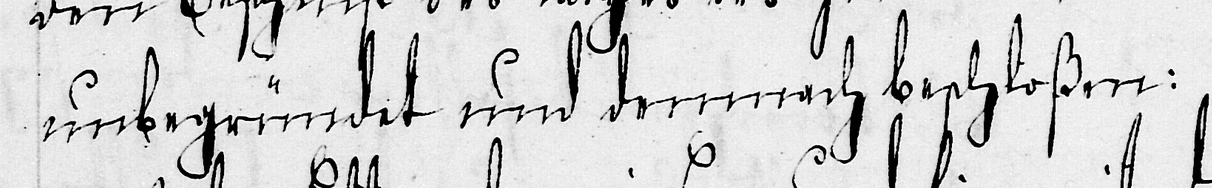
unbegründet und demnach beschloßen:
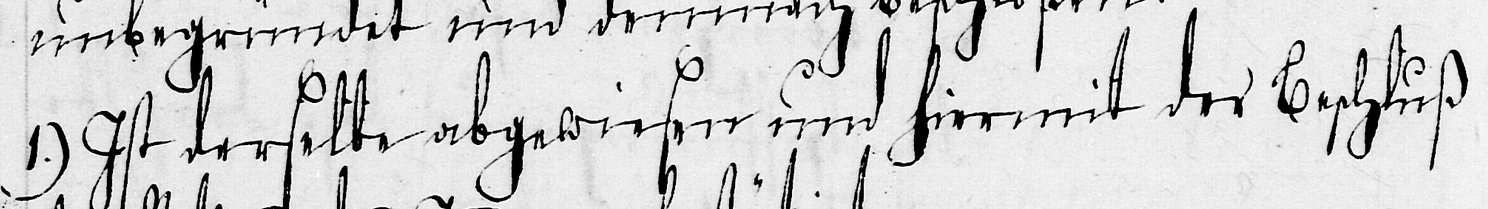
1.) Ist derselbe abgewiesen und hiermit der Beschluß
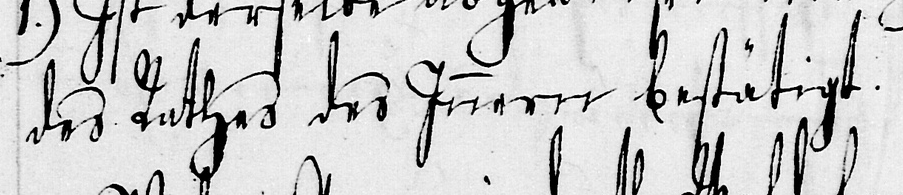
des Rathes des Innern bestätigt.
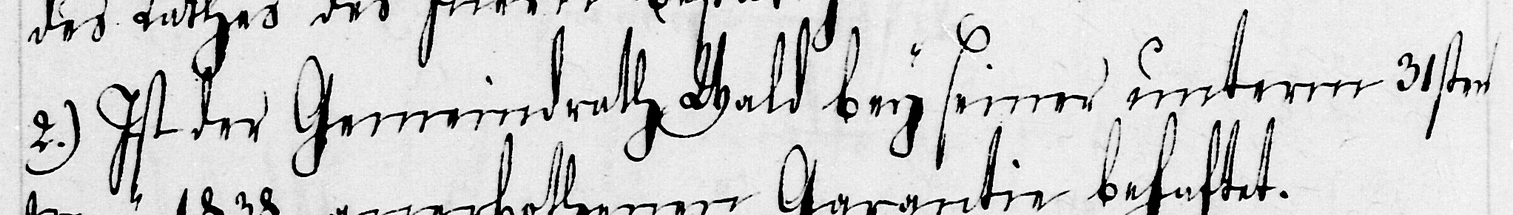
2.) Ist der Gemeindrath Wald bey seiner unterm 31sten
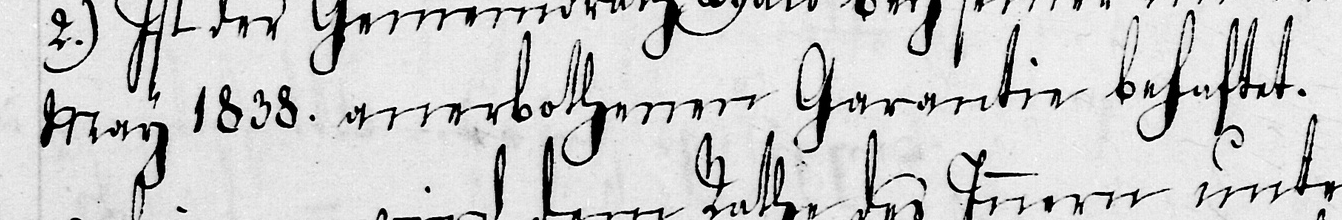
May 1838. anerbothenen Garantie behaftet.
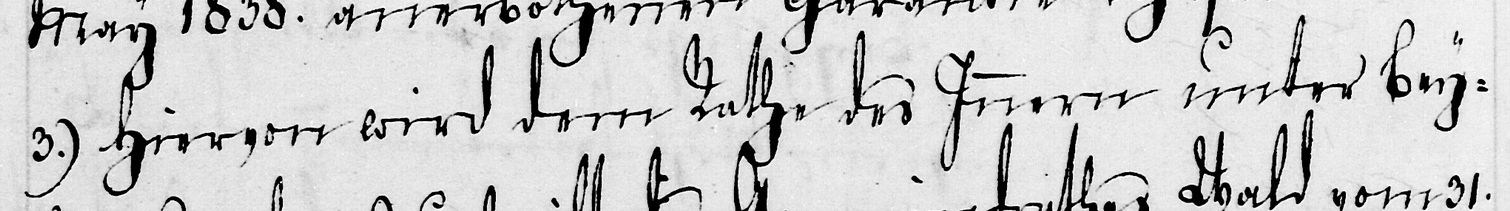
3.) Hiervon wird dem Rathe des Innern unter Bey¬
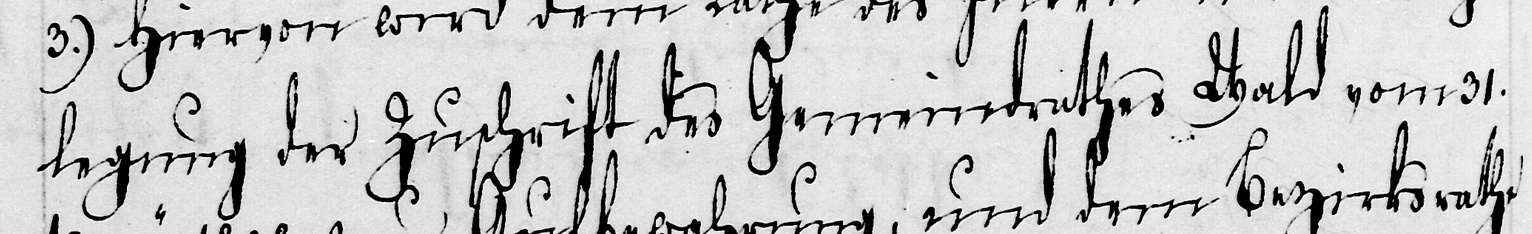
legung der Zuschrift des Gemeindrathes Wald vom 31.
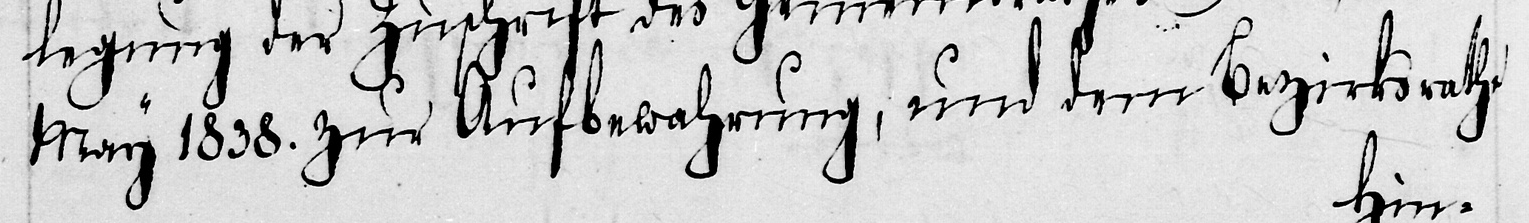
May 1838. zur Aufbewahrung, und dem Bezirksrathe
